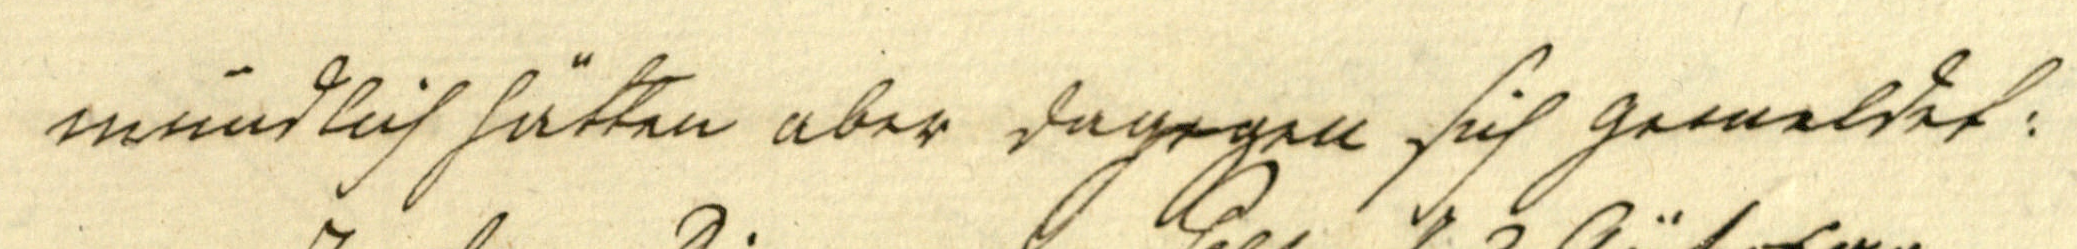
mündlich hätten aber dagegen sich gemeldet.
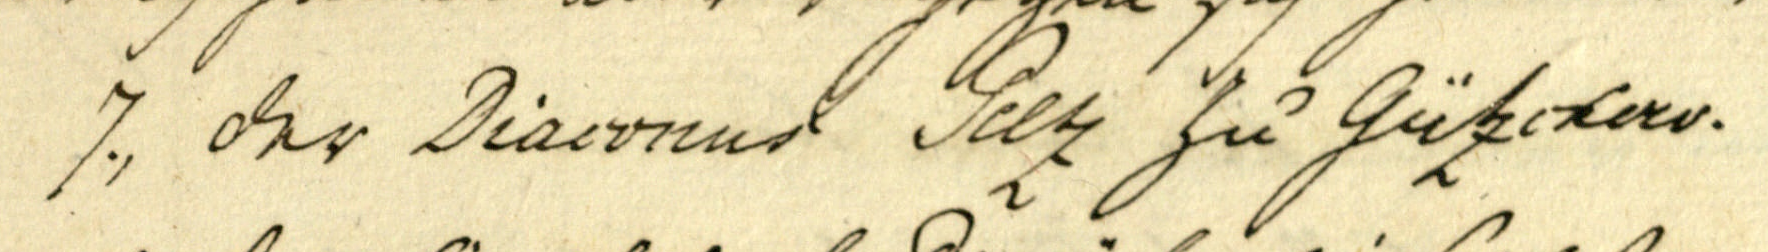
7., der Diaconus Peltz zu Gützckow.
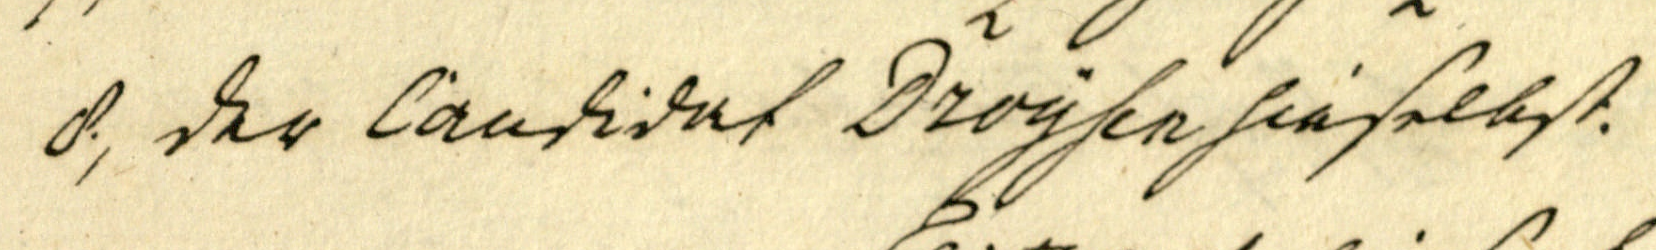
8, der Candidat Droÿsen hieselbst.
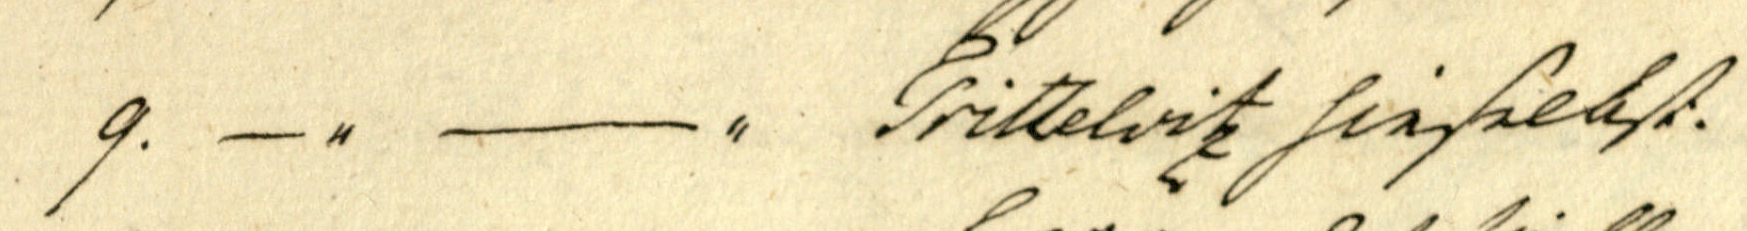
9. — " — " Trittelvitz hieselbst.
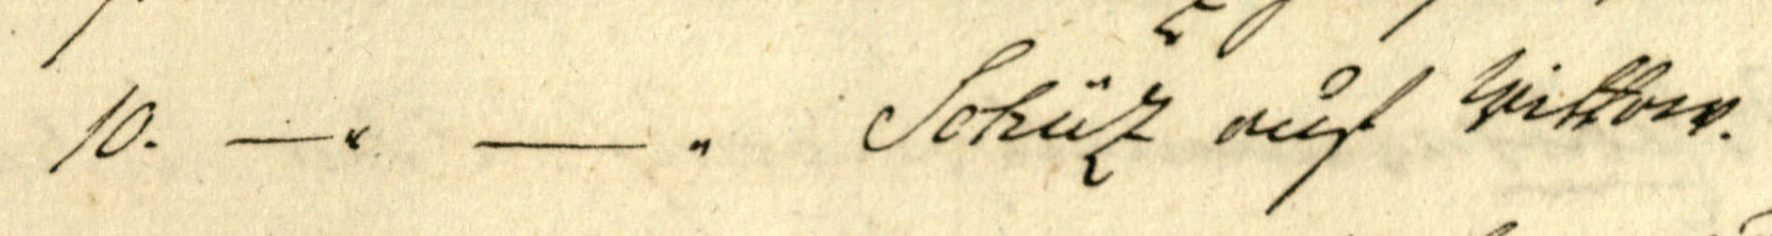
10. e " — " Schüz auf Wittow.
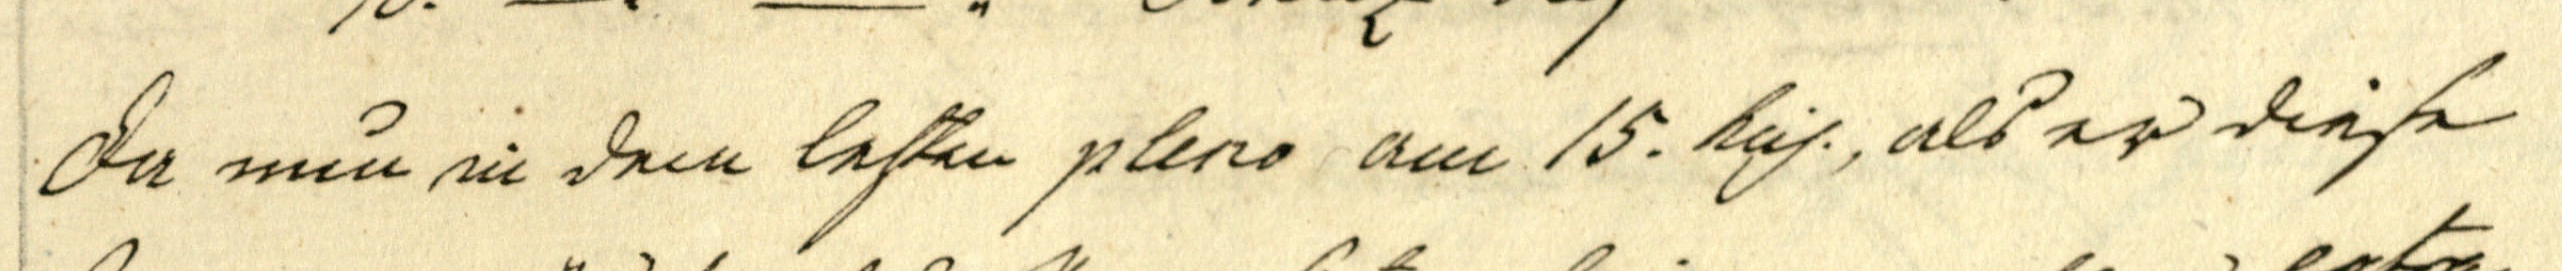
Da nun in dem letzten pleno am 15. huj., als er diese
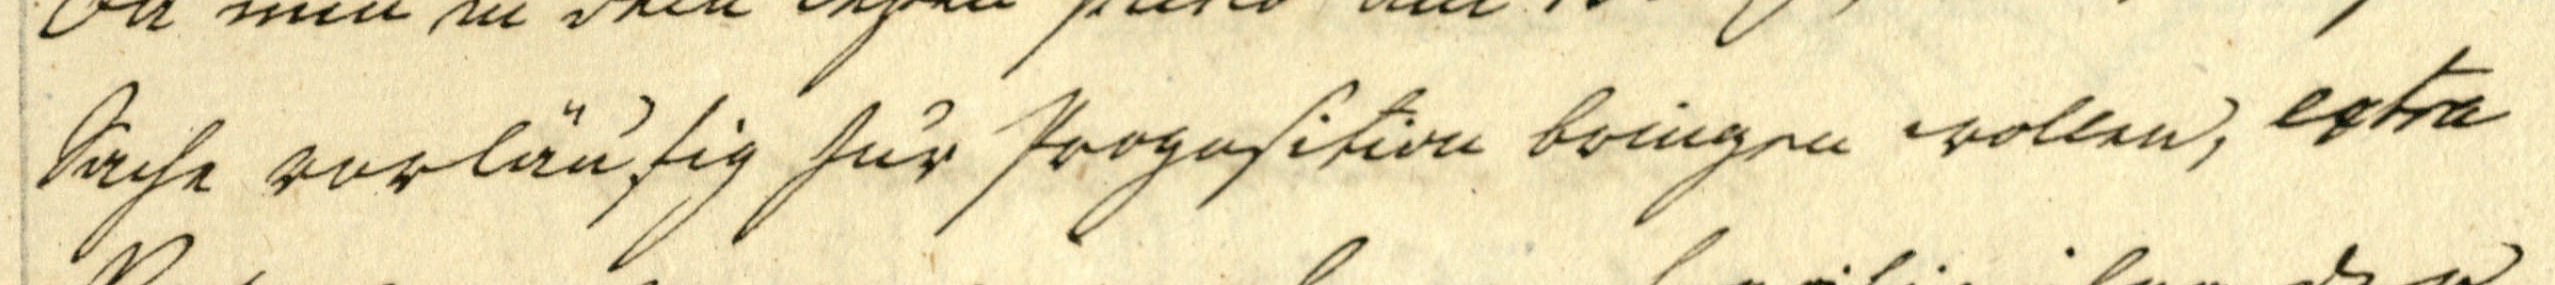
Sache vorläufig zur Proposition bringen wollen, extra
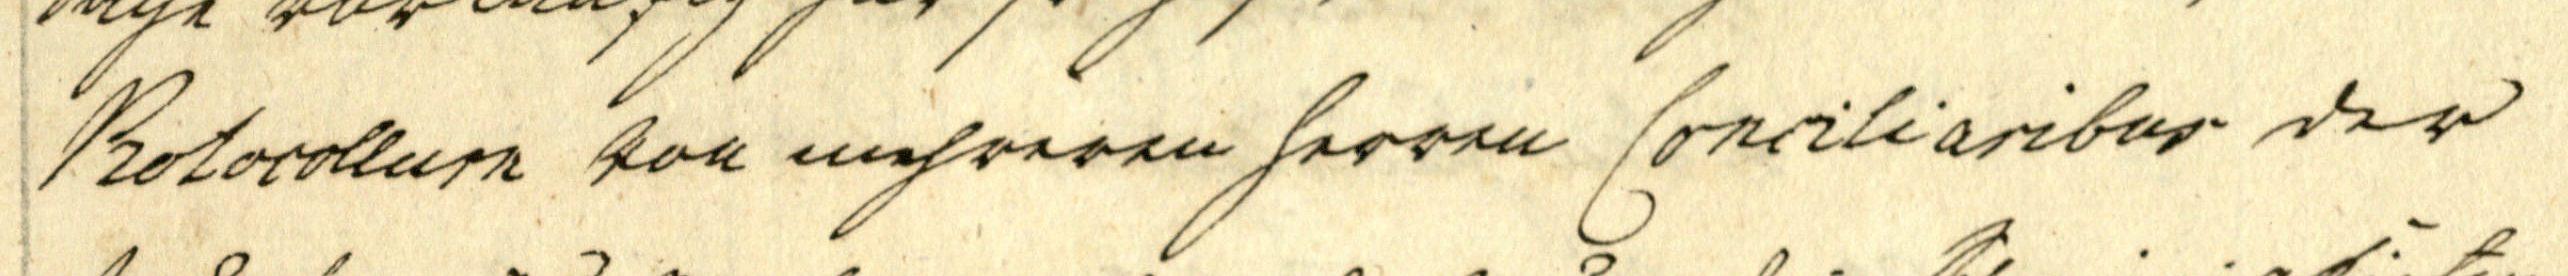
Protocollum von mehreren Herren Conciliaribus der
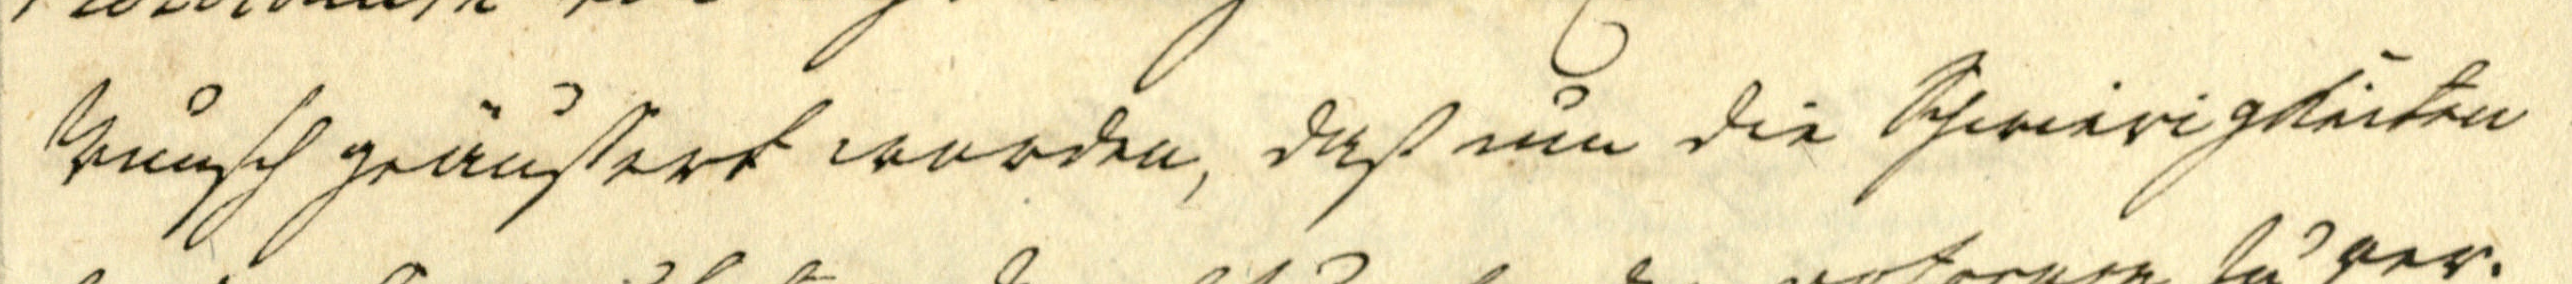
Wunsch geäussert worden, daß um die Schwierigkeiten
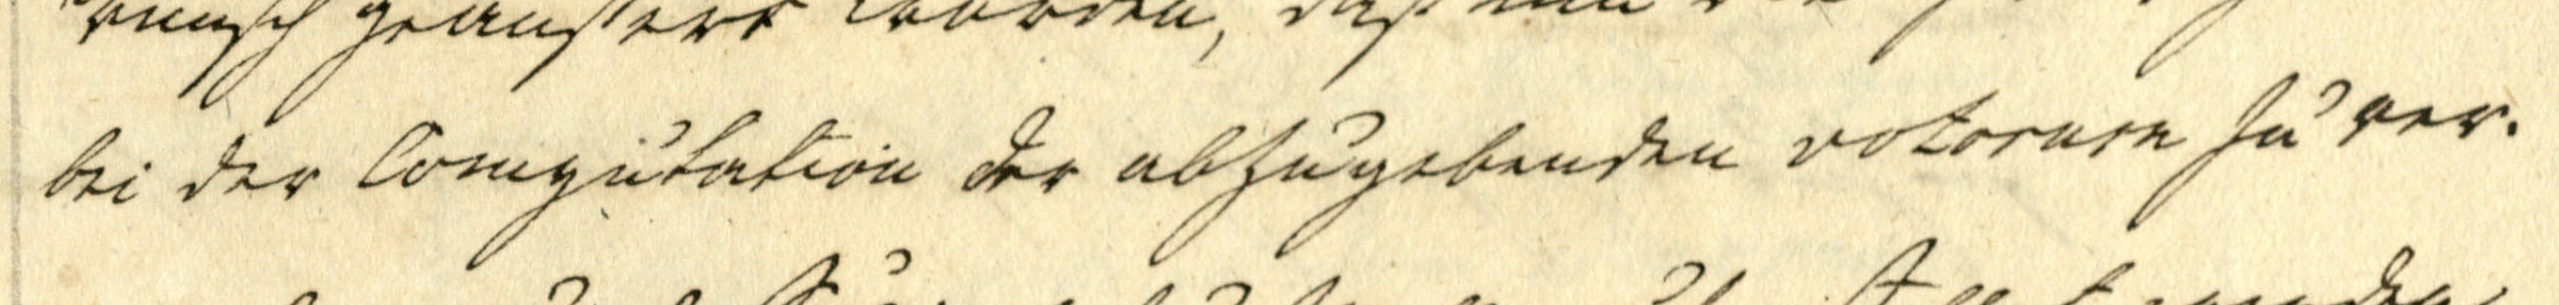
bei der Comgutation der abzugebenden votorum zu ver¬
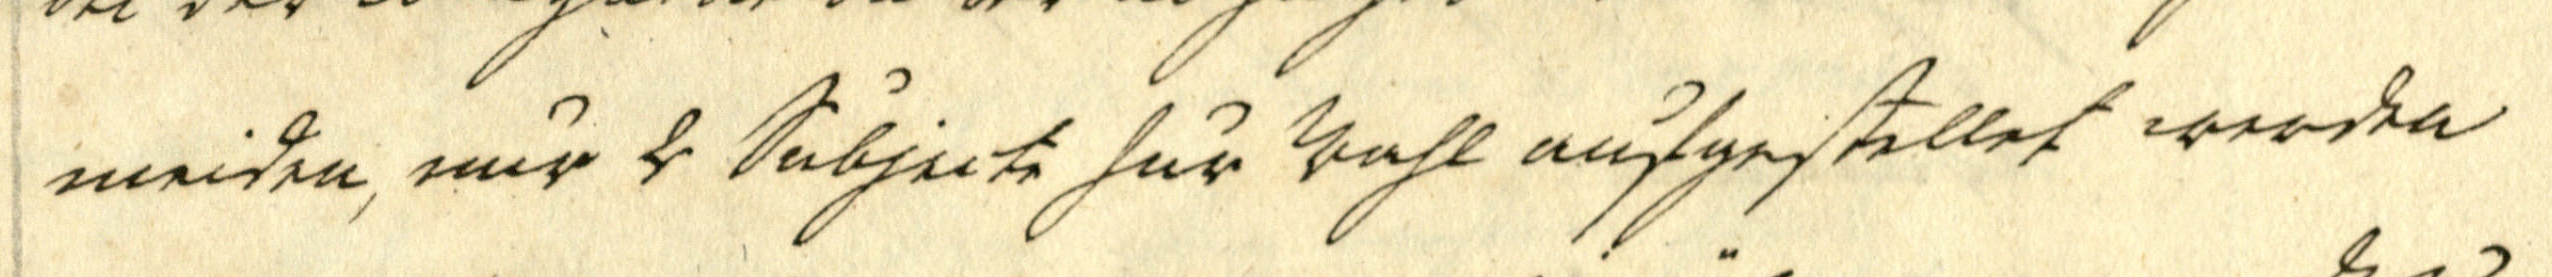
meiden, nur 2 Subjecte zur Wahl aufgestellet werden
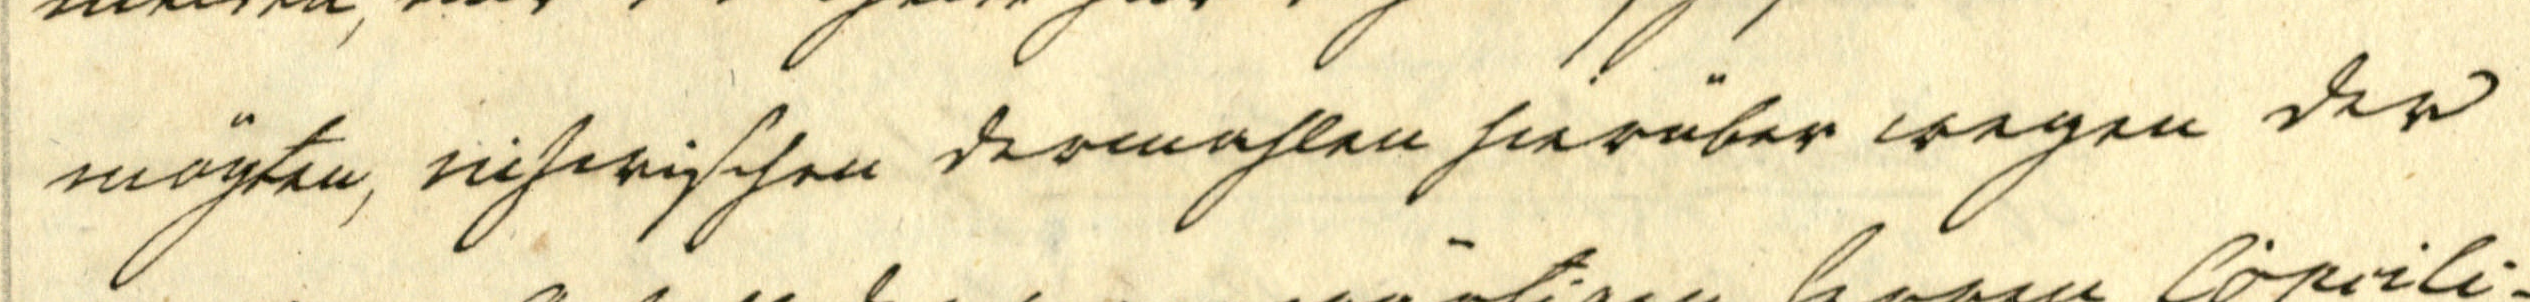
mögten, inzwischen dermahlen hierüber wegen der
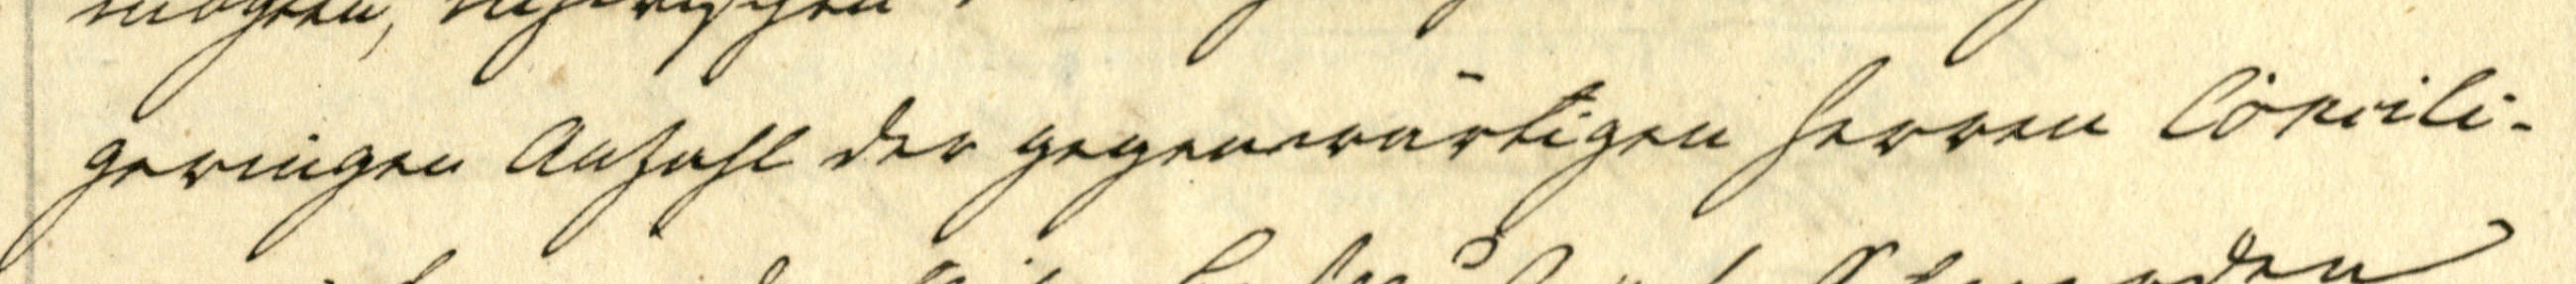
geringen Anzahl der gegenwärtigen Herren Concili¬
